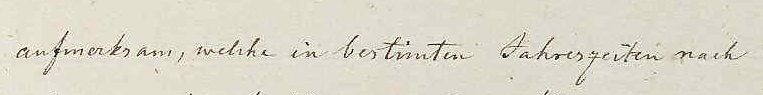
aufmerksam, welche in bestimten Jahreszeiten nach
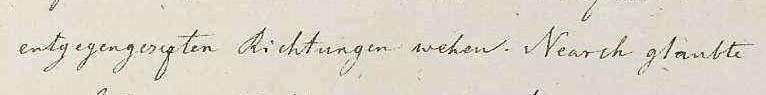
entgegengesezten Richtungen wehen. Nearch glaubte
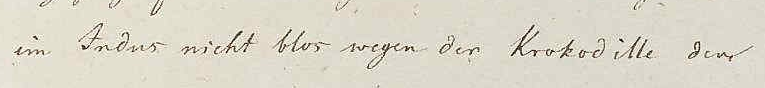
im Indus nicht blos wegen der Krokodille den
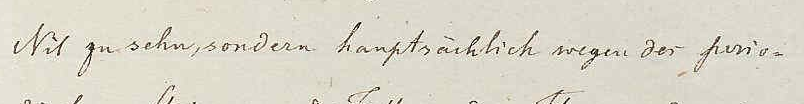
Nil zu sehn, sondern hauptsächlich wegen des perio-
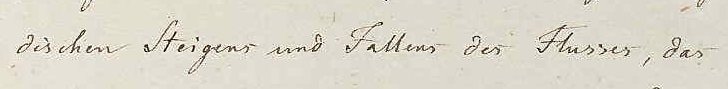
dischen Steigens und Fallens des Flusses, das
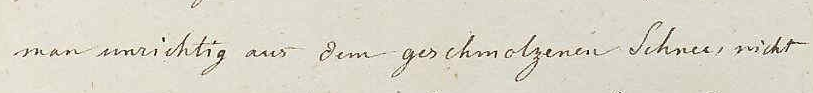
man unrichtig aus dem geschmolzenen Schnee, nicht
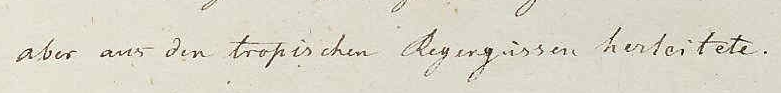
aber aus den tropischen Regengüssen herleitete.
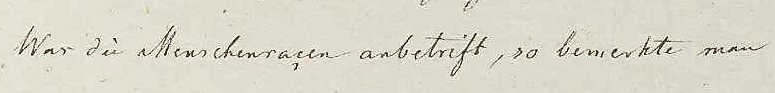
Was die Menschenraçen anbetrift, so bemerkte man
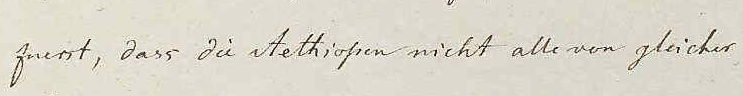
zuerst, dass die Aethiopen nicht alle von gleicher
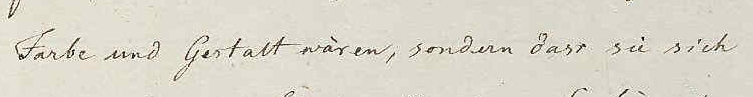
Farbe und Gestalt wären, sondern dass sie sich
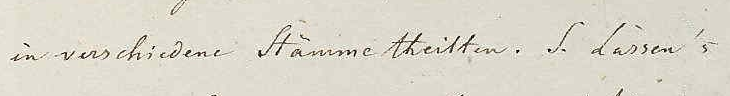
in verschiedene Stämme theilten. S. Lassen's
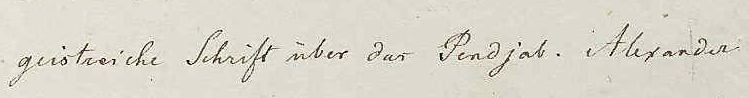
geistreiche Schrift über das Pendjab. Alexander
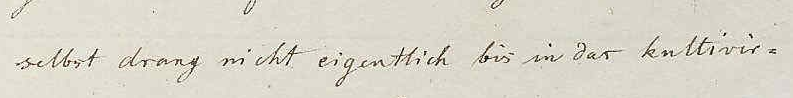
selbst drang nicht eigentlich bis in das kultivir-
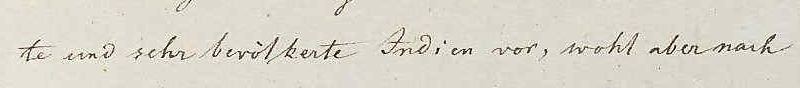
te und sehr bevölkerte Indien vor, wohl aber nach
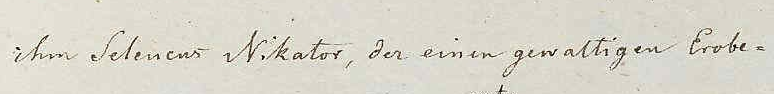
ihm Seleucus Nikator, der einen gewaltigen Erobe-
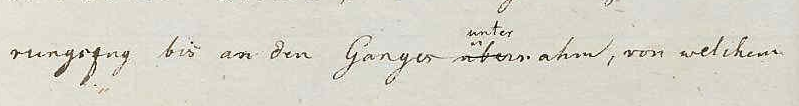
rungszug bis an den Ganges überunternahm, von welchem
